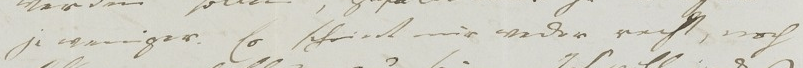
je weniger. Es scheint mir weder recht, noch
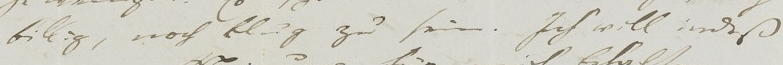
billig, noch klug zu sein. Ich will indeß
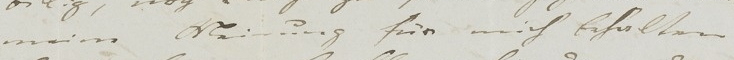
meine Meinung für mich behalten,
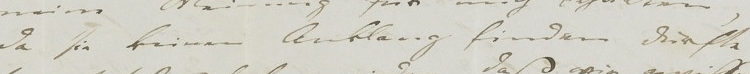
da sie keinen Anklang finden dürfte. –
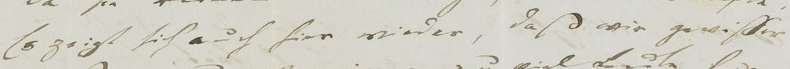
Es zeigt sich auch hier wieder, daß wir gewisser-
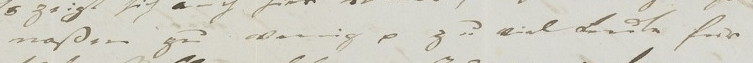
maßen zu wenig & zu viel Leute für
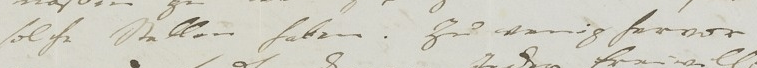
solche Stellen haben. Zu wenig hervor-
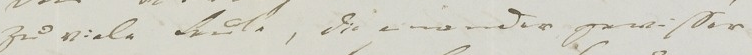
zu viele Leute, die einander gewisser-
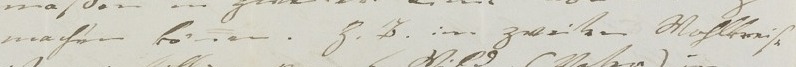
machen können. Z. B. im zweiten Wahlkreise
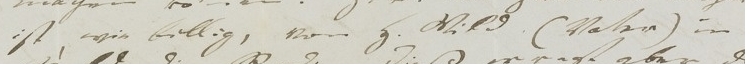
ist, wie billig, von H. Wild (Vater) in
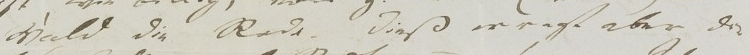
Wald die Rede. Dieß erregt aber die
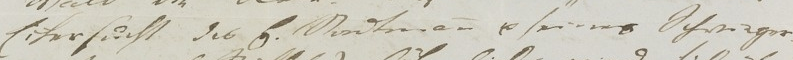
Eifersucht des H. Stadtmann & seines Schwieger-
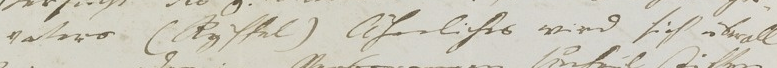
vaters ( Ryffel ). Ähnliches wird sich überall
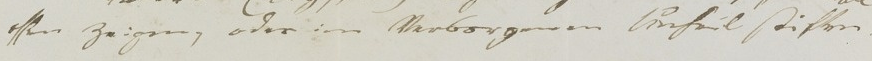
offen zeigen, oder im Verborgenen Unheil stiften.
